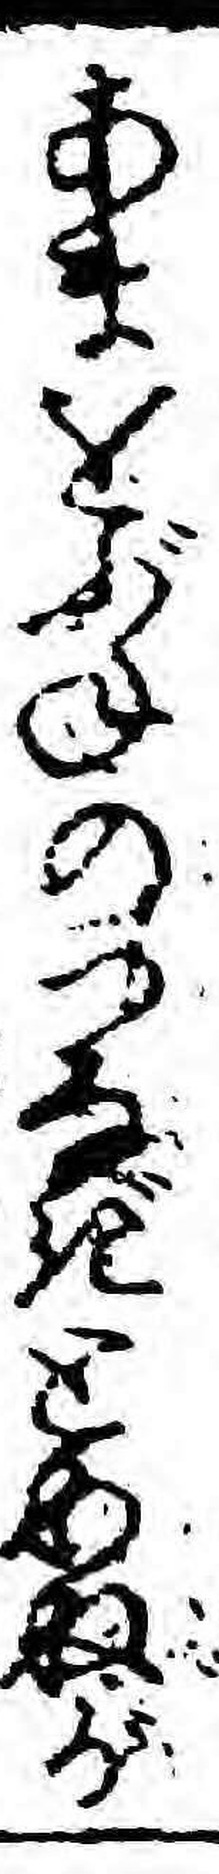あまをぶねのつなぎとめぬが
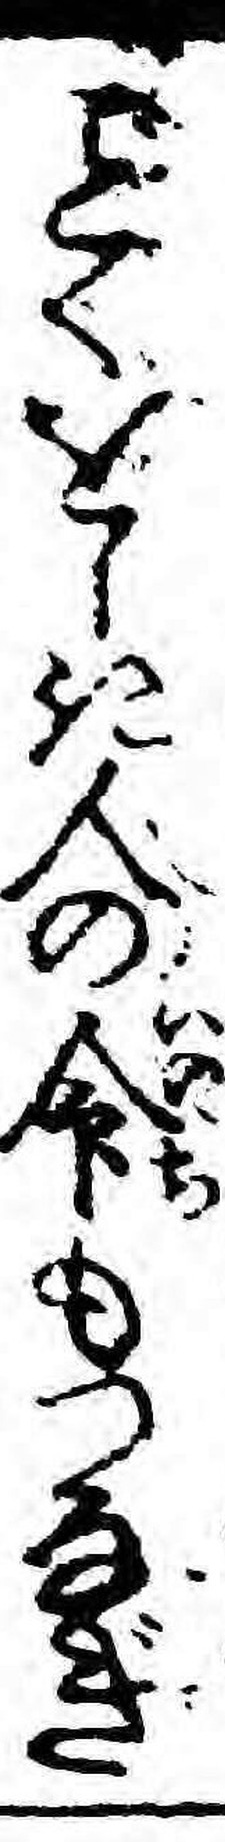ごとくをしき人の命もつなぎ
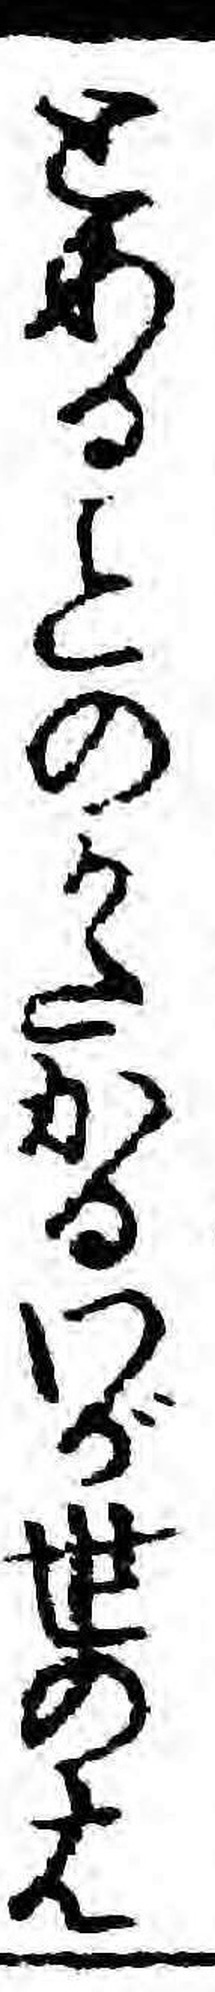とめることのかたかるわが世のは
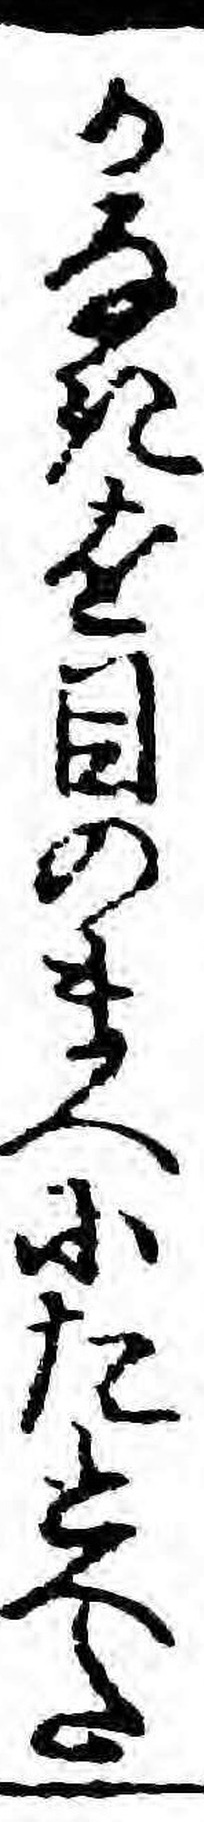かなきを目のまへにたとへた
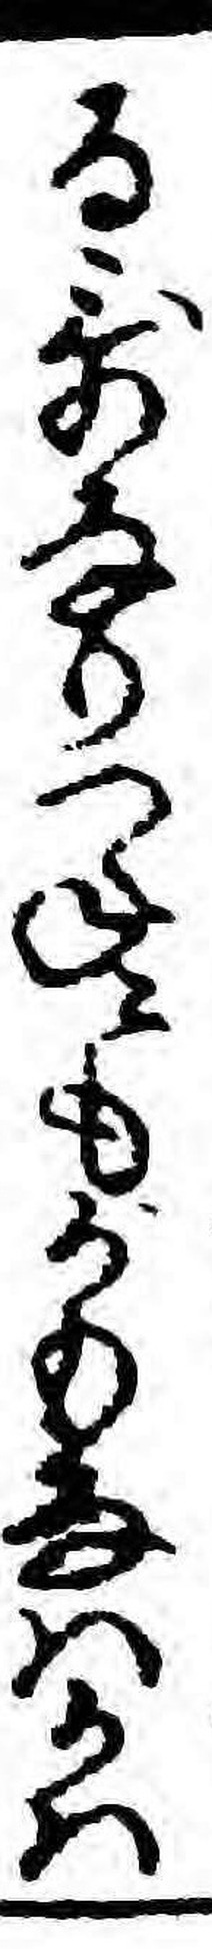る哥なりつねにもがもなはかは
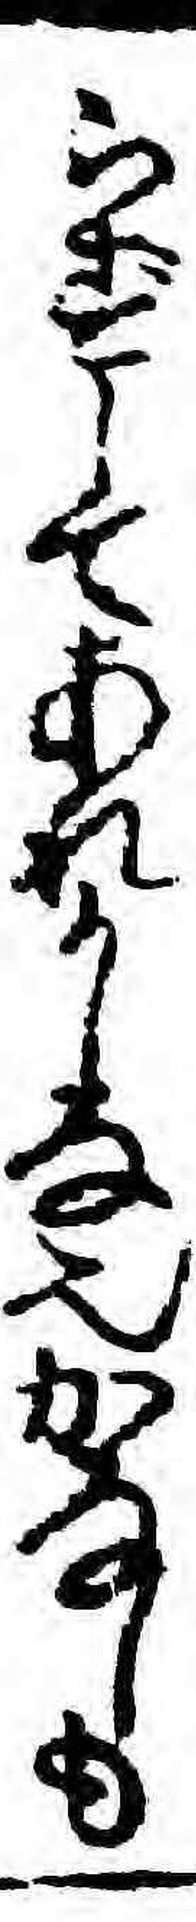らずしてあれかしな也かなしも
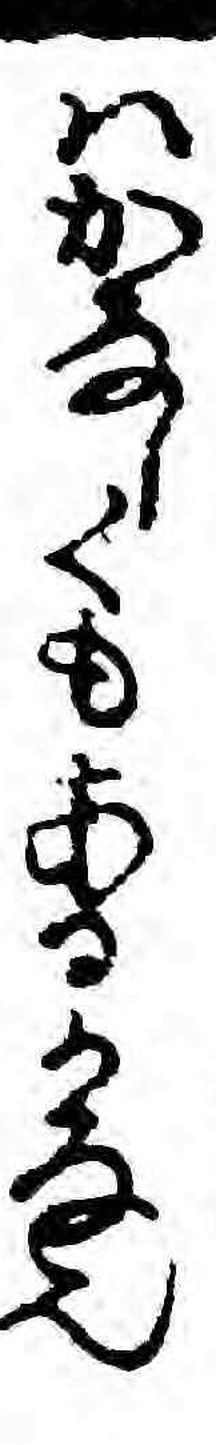はかなしくもあるかな也
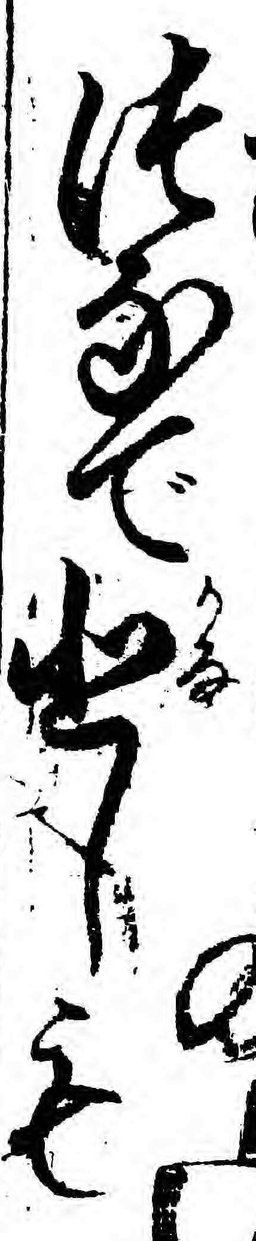つなで悲しも

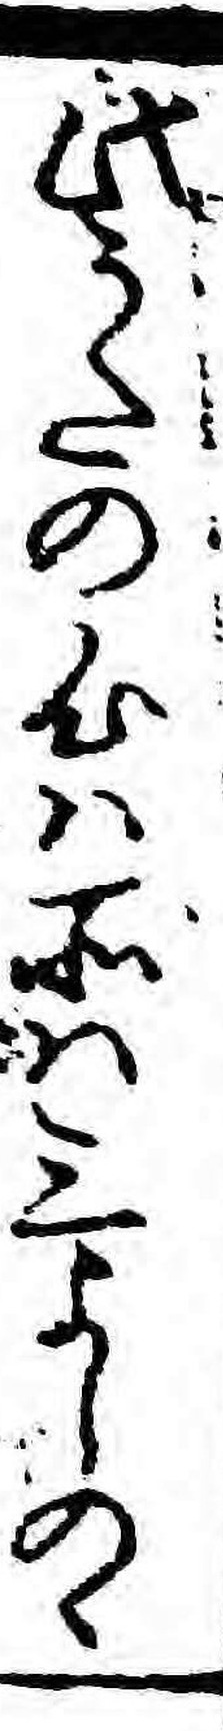此うたの心は所は三よしのゝ
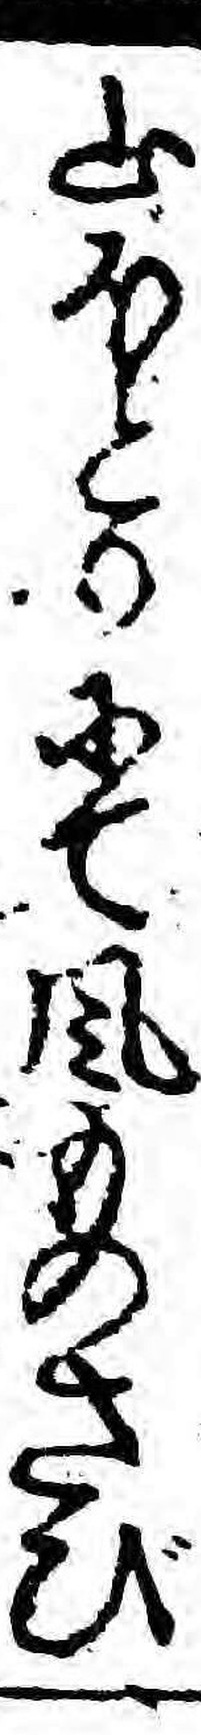山ほとりにて風ものさび
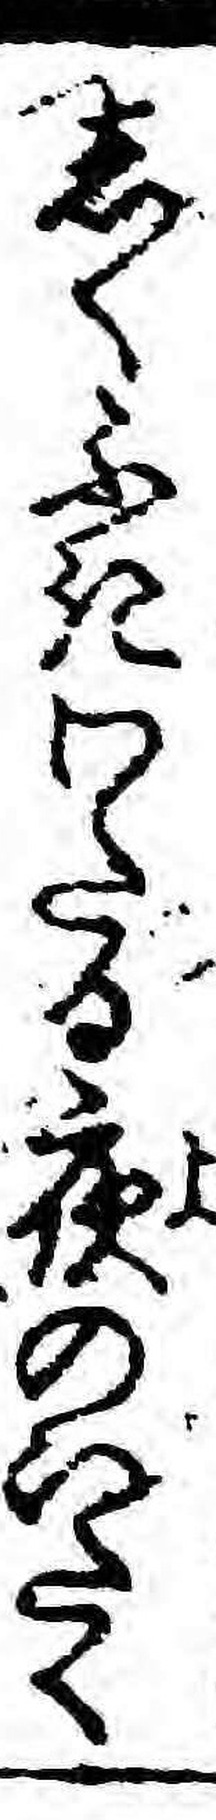しくふきわたる夜のいたく
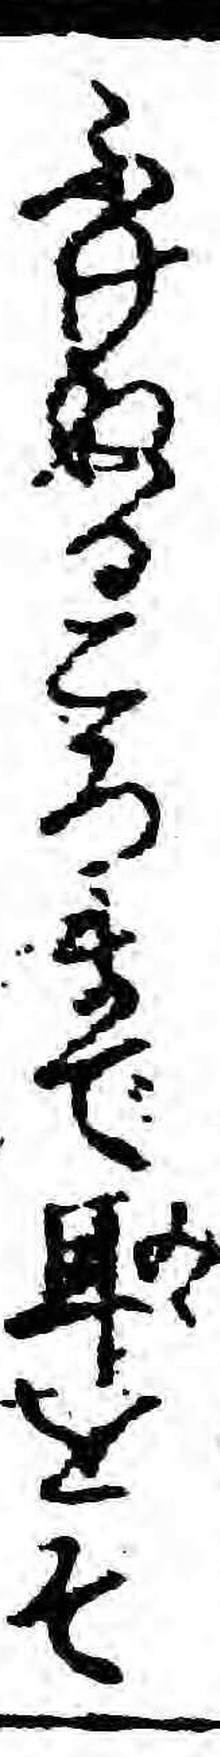ふけぬるころまで耳をそ
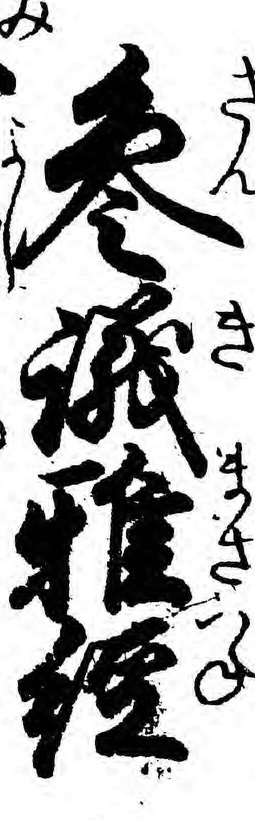参議雅経
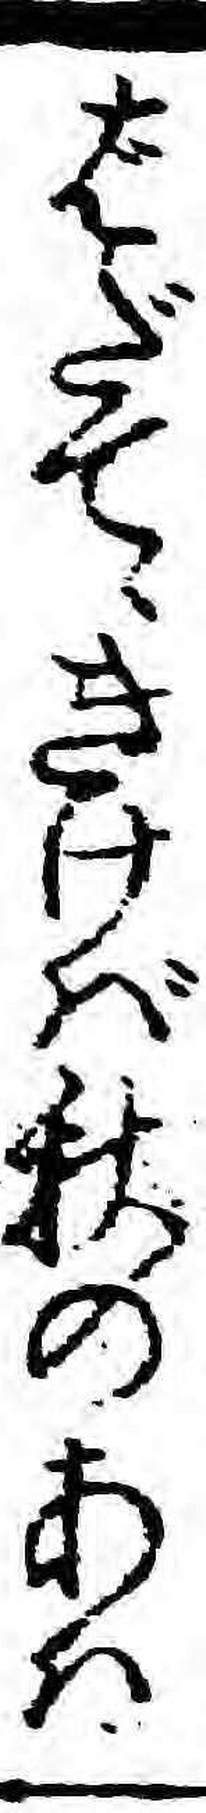ばだてゝきけば秋のあは
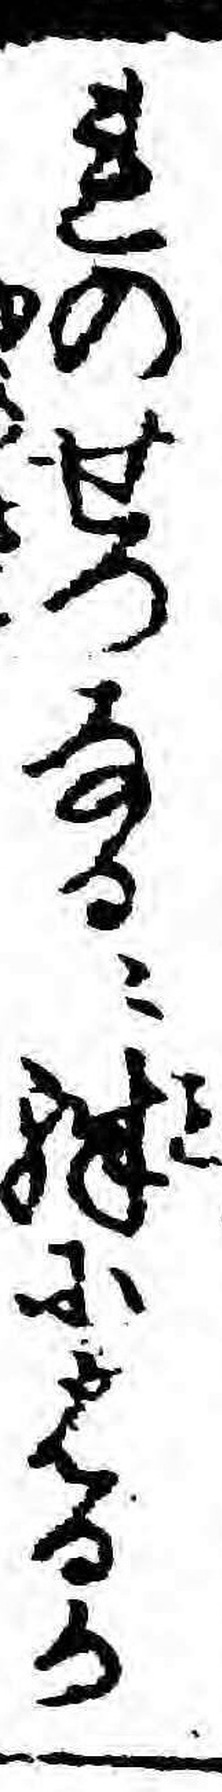れのせつなるに殊にはるか
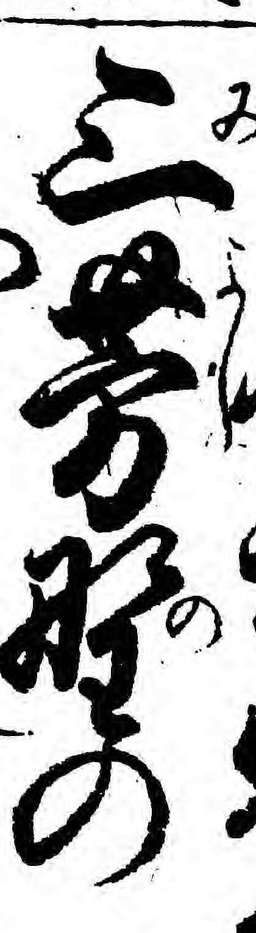三芳野の
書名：頭書和歌注譯／壽賀多百人一首小倉錦
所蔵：国文学研究資料館
